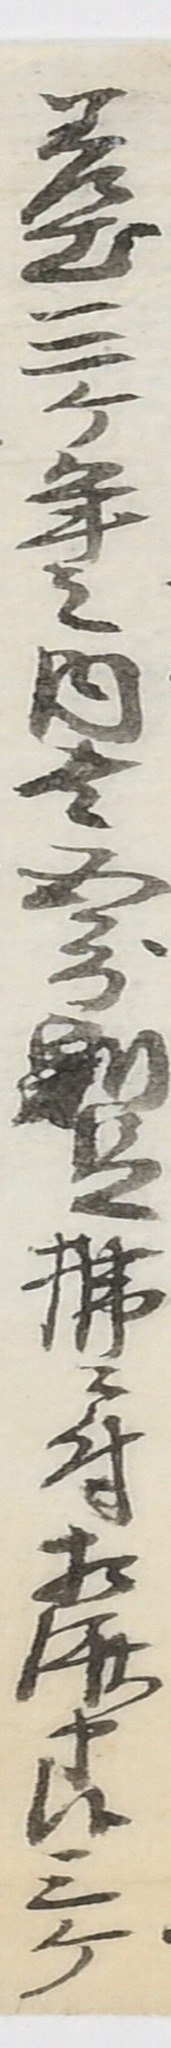差出三ヶ年之内者五分割足払ニ付相済申候三ヶ
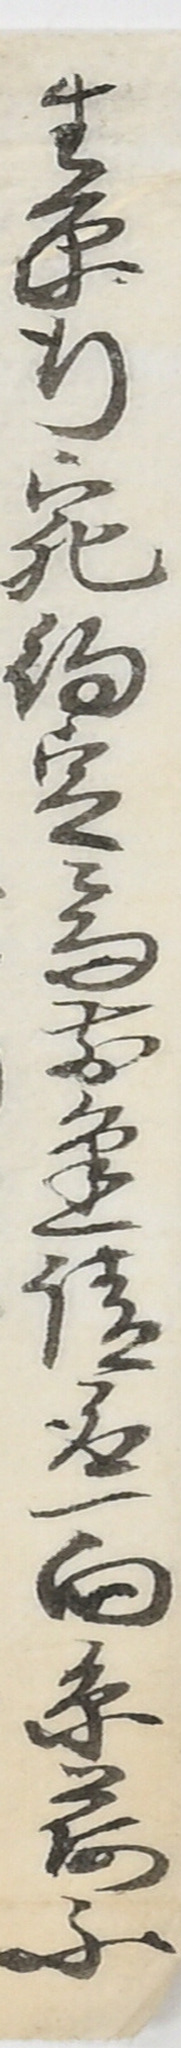生原行宛約定ニ而前金請取一白糸荷不
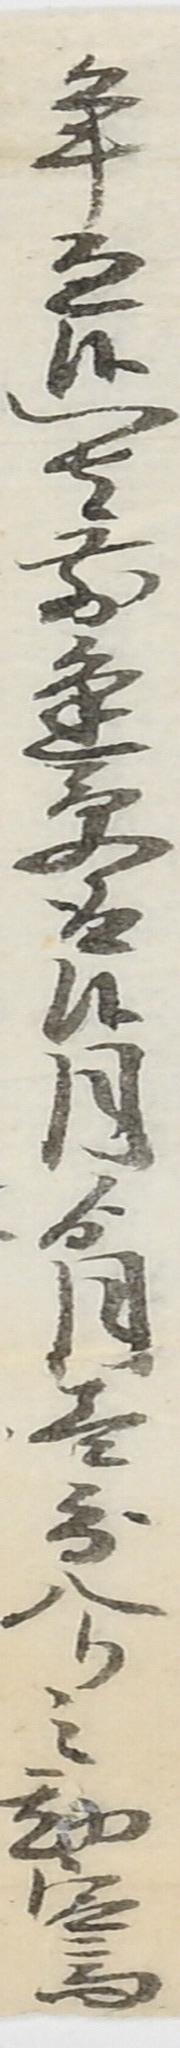年過候ヘ者金受取候月ゟ月壱分八厘之勘定ニ而
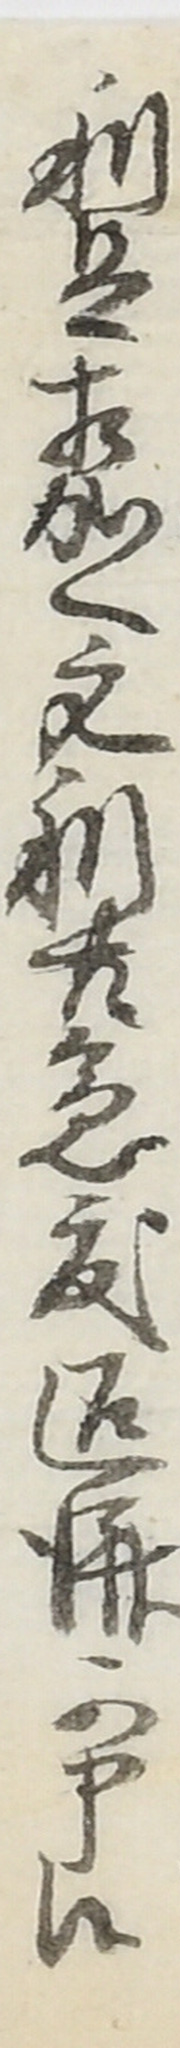利足相加ヘ元利共急度返済可申候

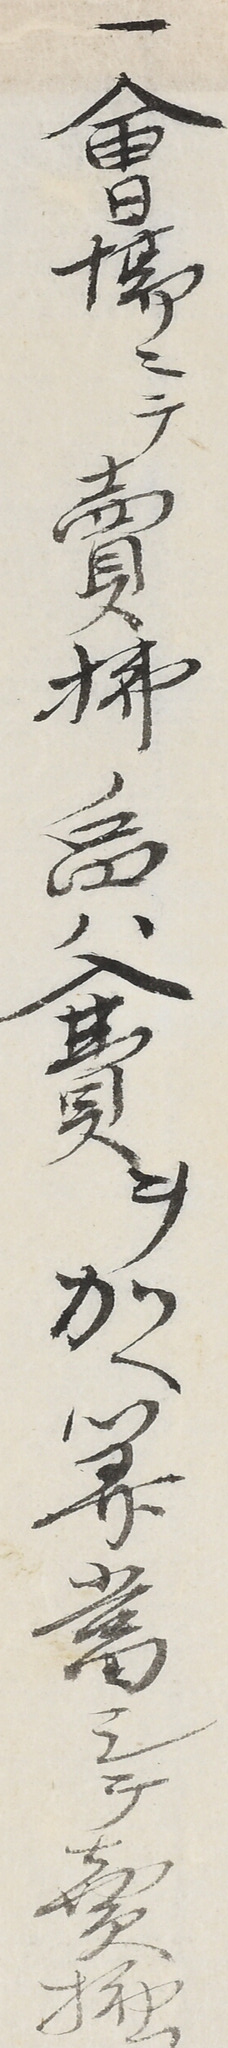一会場ニテ売払ノ品ｈ入費ヲ加ヘ算当シテ売
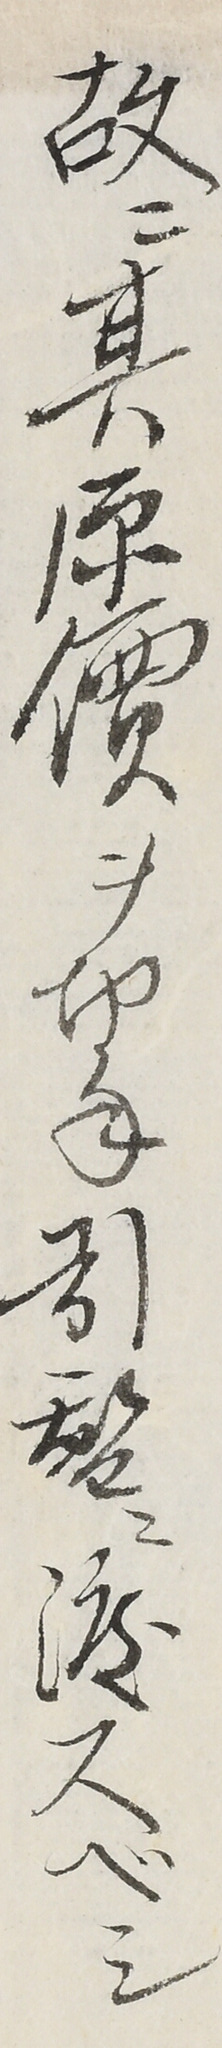故ニ其原価ヲ切手引替ニ渡スベシ
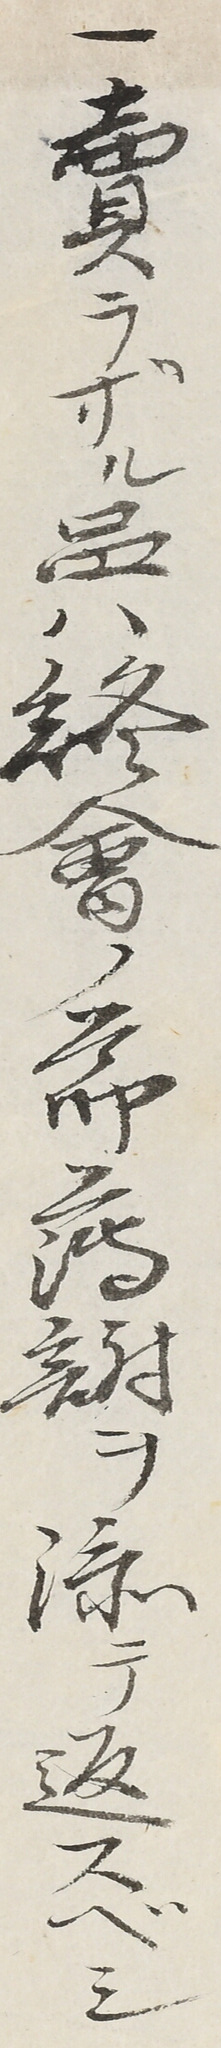一売ラザル品ハ終会ノ節薄謝ヲ添テ返スベシ
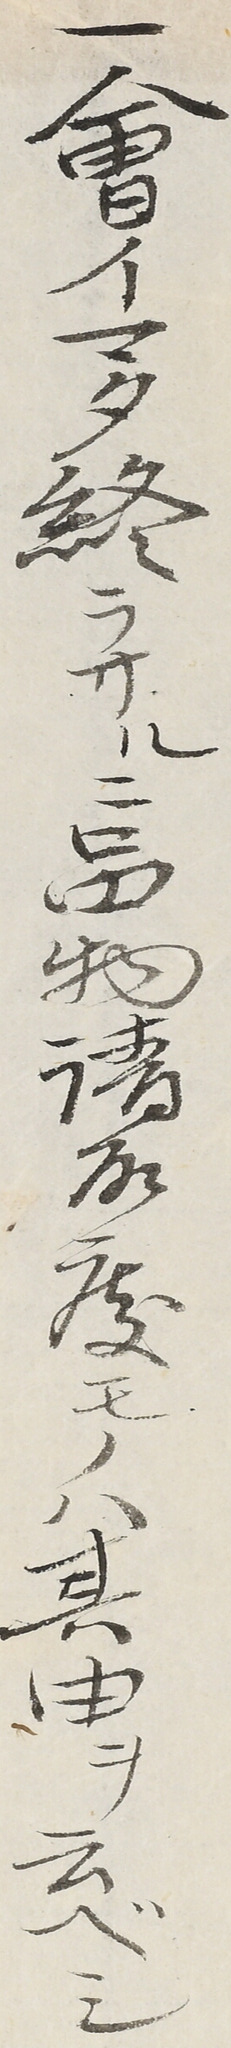一会イマタ終ラサルニ品物請取度モノハ其由ヲ云ベシ
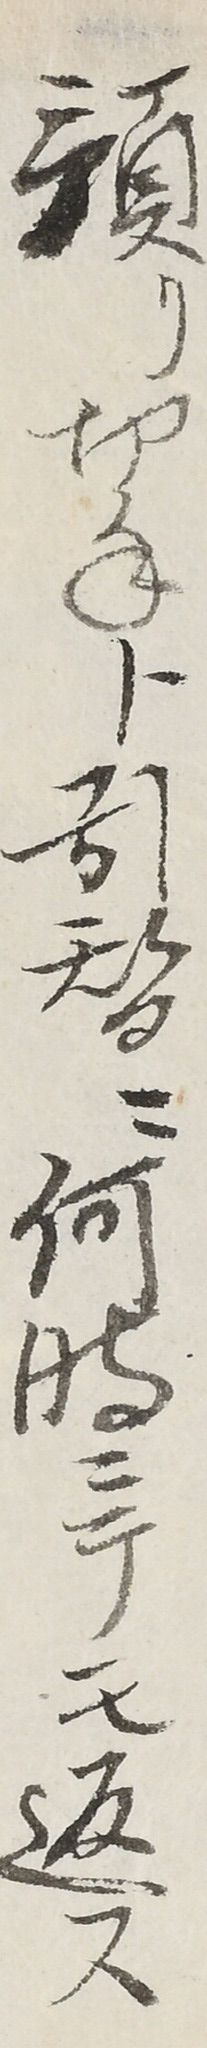預り切手ト引替ニ何時ニテモ返ス
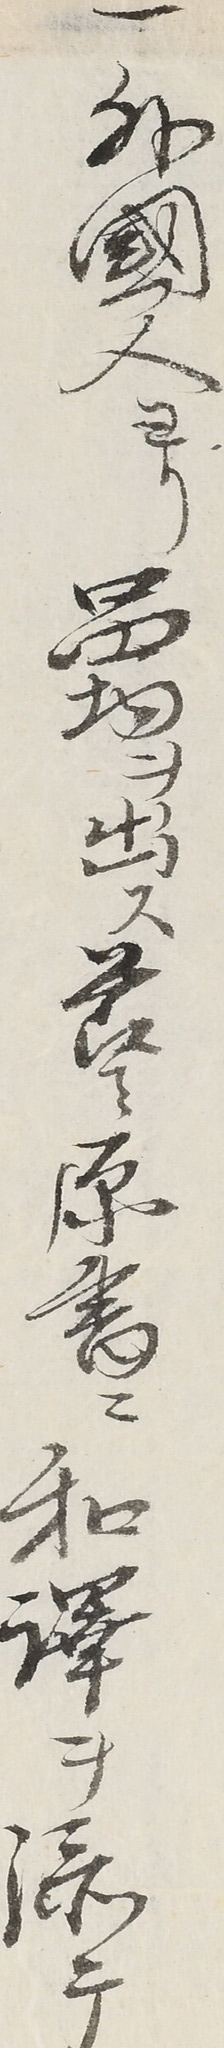一外国人ヨリ品物を出ス節は原書ニ和訳ヲ添テ
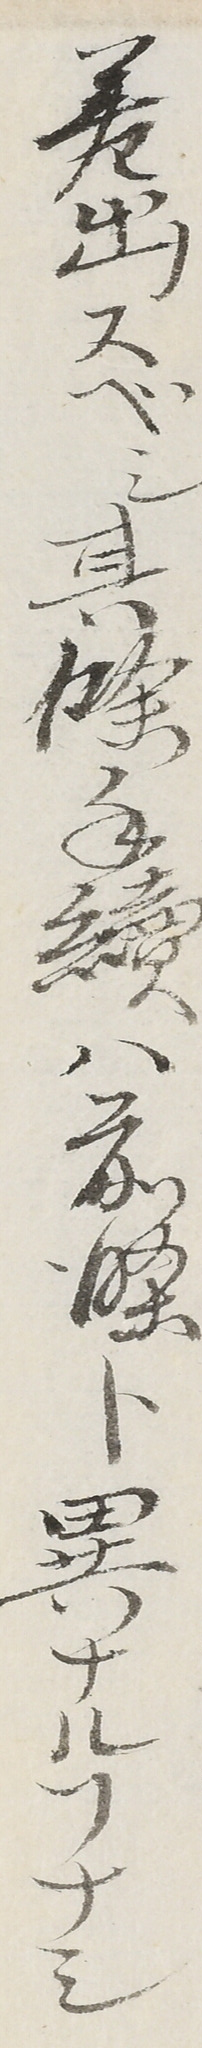差出スベシ其除手続ハ前條ト異ナルコトナシ
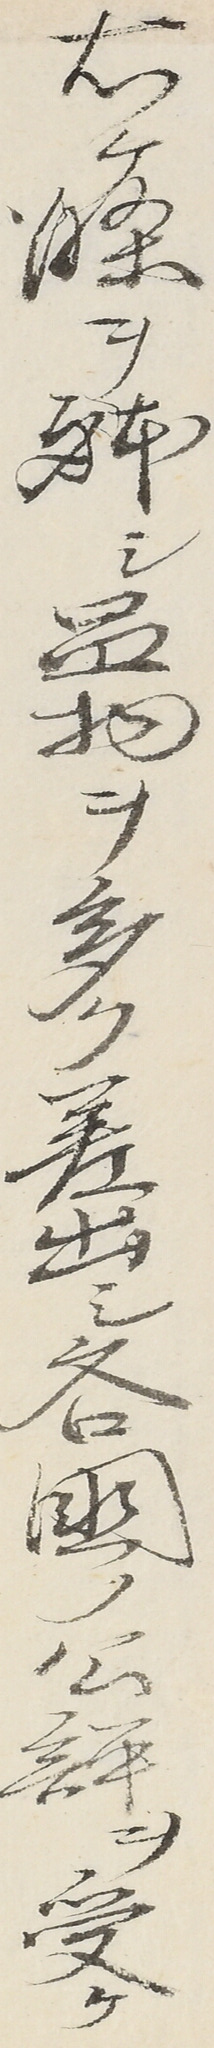右ヶ條躰シ品物ヲ多ク差出シ各国ノ公評ヲ受ヶ
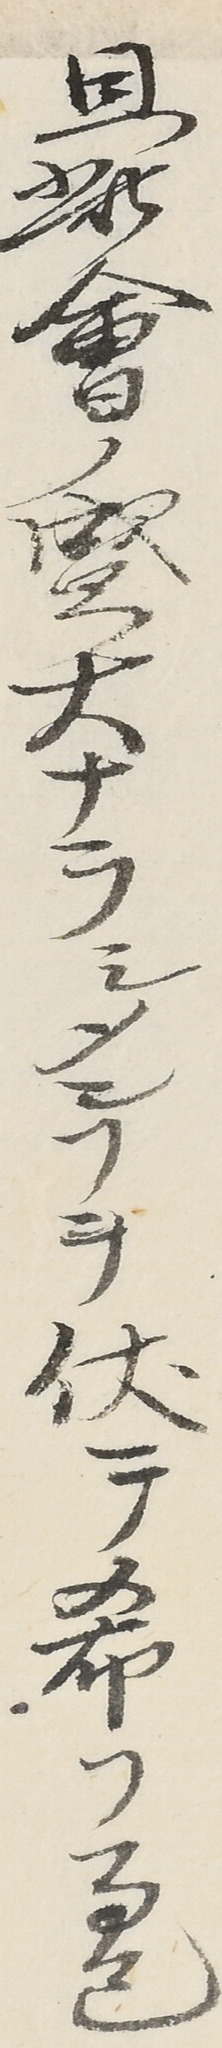且此会ノ盛大ナラシメンコトヲ伏テ希フ而已
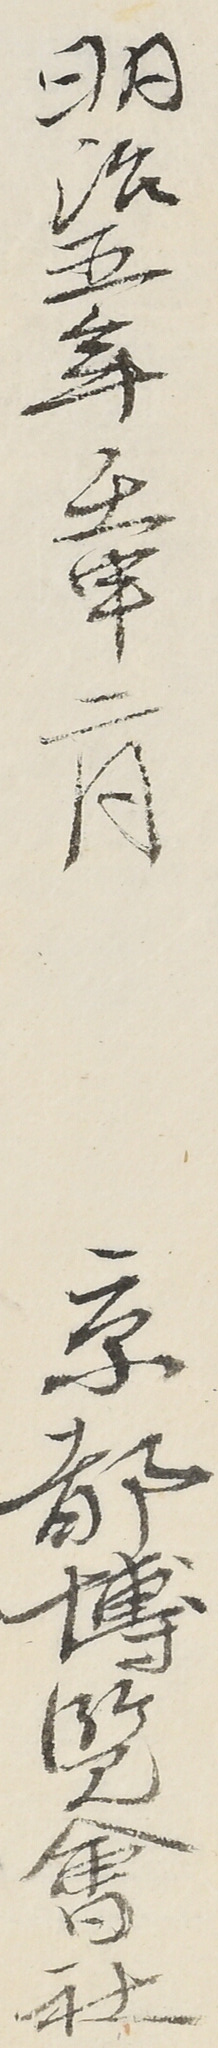明治五年壬申二月京都博覧会社
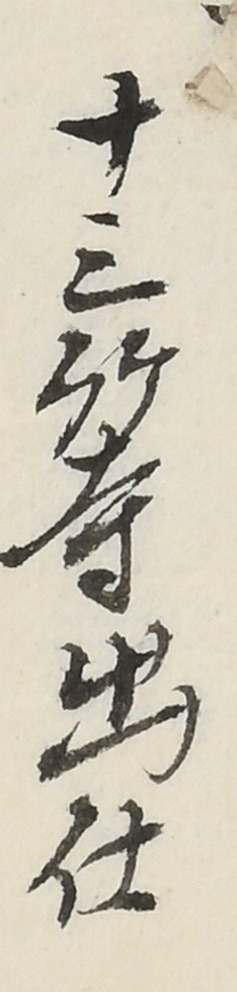十三等出仕
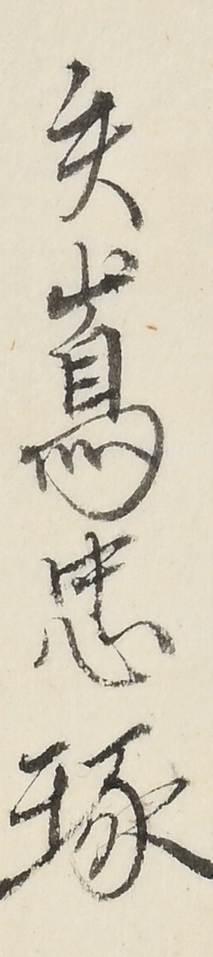矢嶌忠琢
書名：廻状（控）
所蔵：伊那市立高遠町図書館・合同会社AMANE
